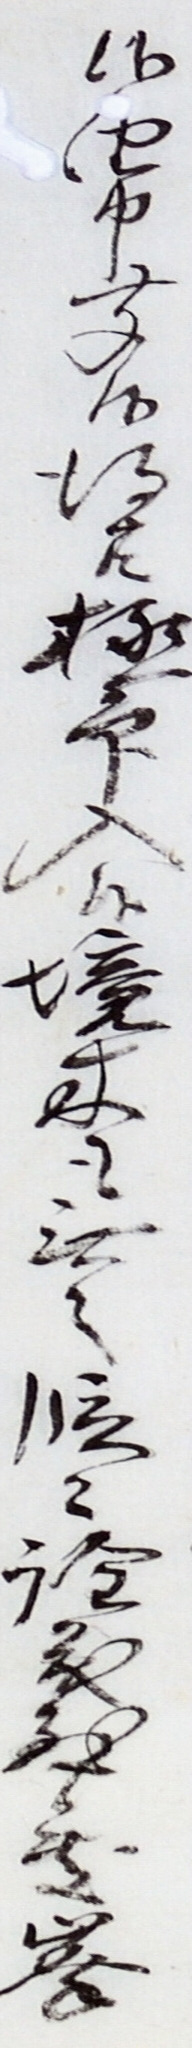候由申聞候得共極印入候境木も無之段々詮義致候処峯
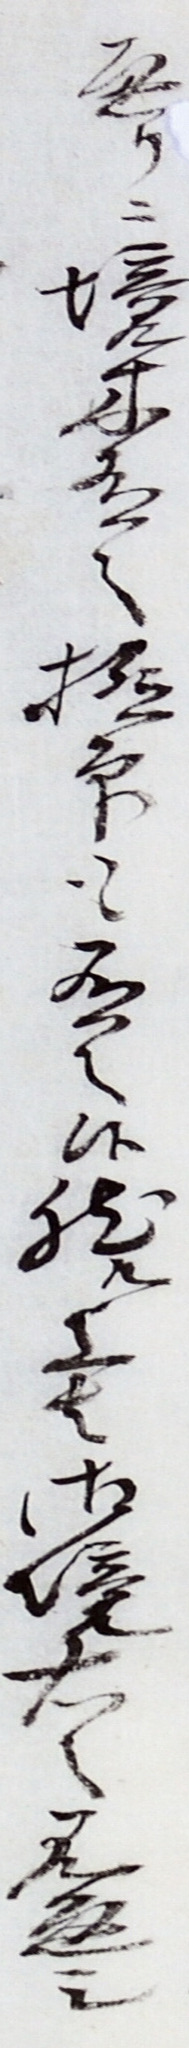通りニ境木有之極印も有之候然ル上は御境右之見返シ
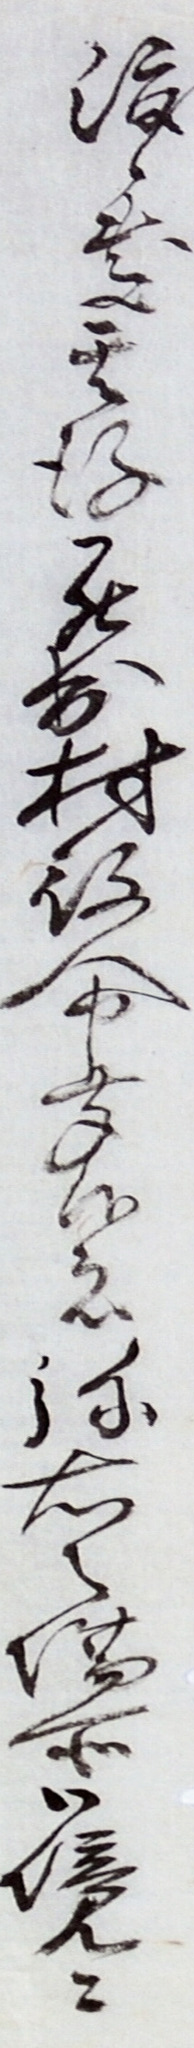渡候処其後罷出村役人申聞候は弥右之場所御境ニ
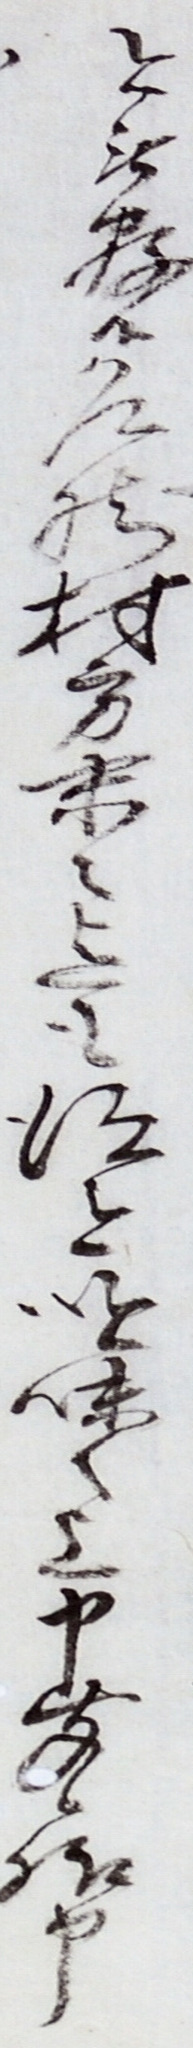と被存候乍然村方末々迄も得と吟味之上申聞候様申
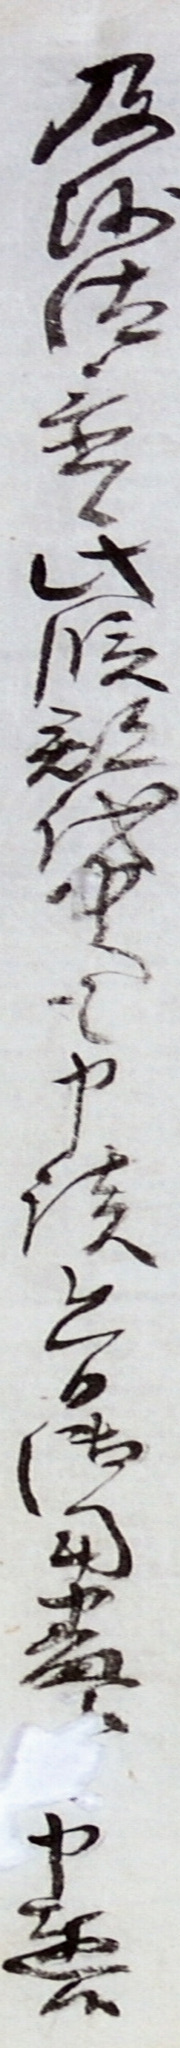及沙汰置候此段郡代中へも申談今日御用番江申達候
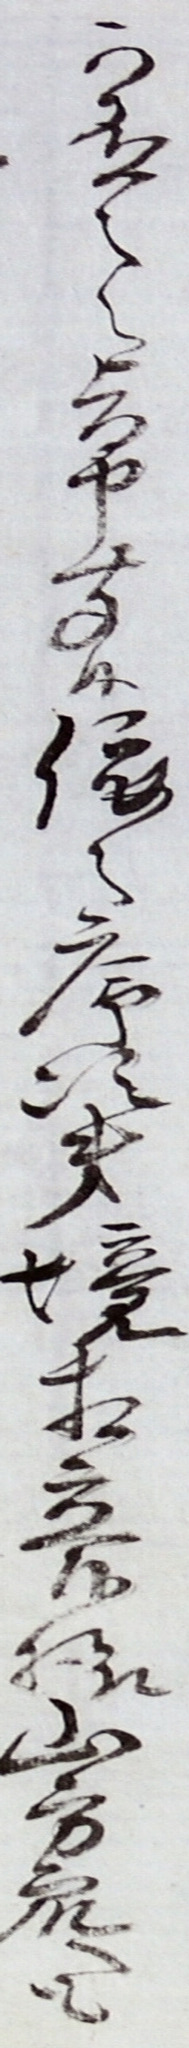可有之候旨申聞候依之序次第境相立候様山方衆へも
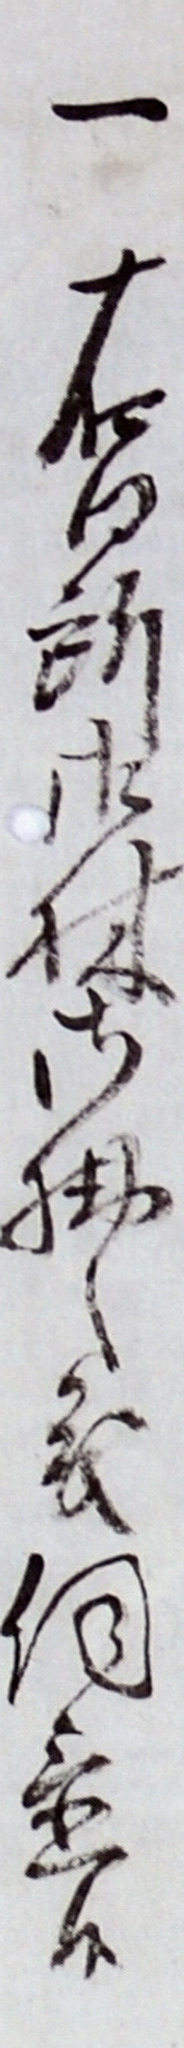一右同所御林御払之義伺置候
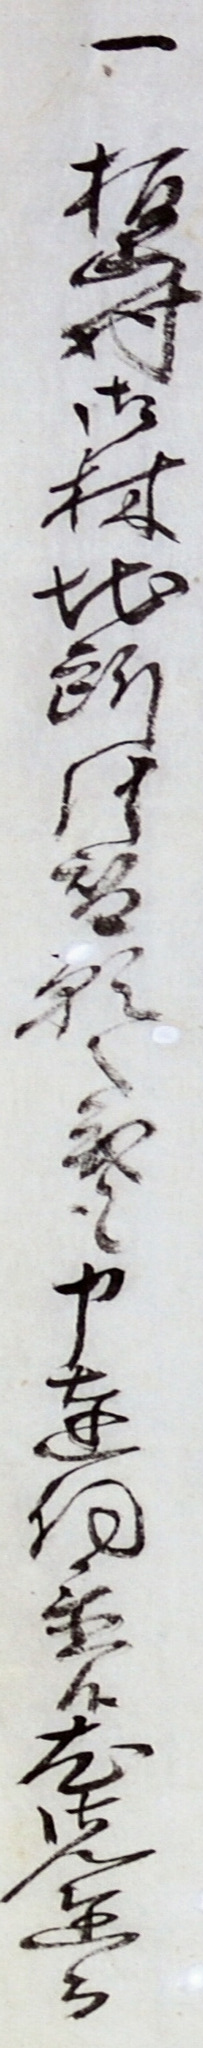一板山村御林地所引替願之義も申達伺置候尤先達而

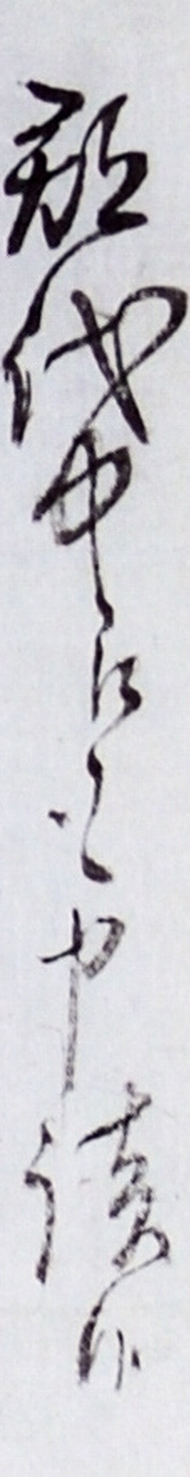郡代中江も申談候
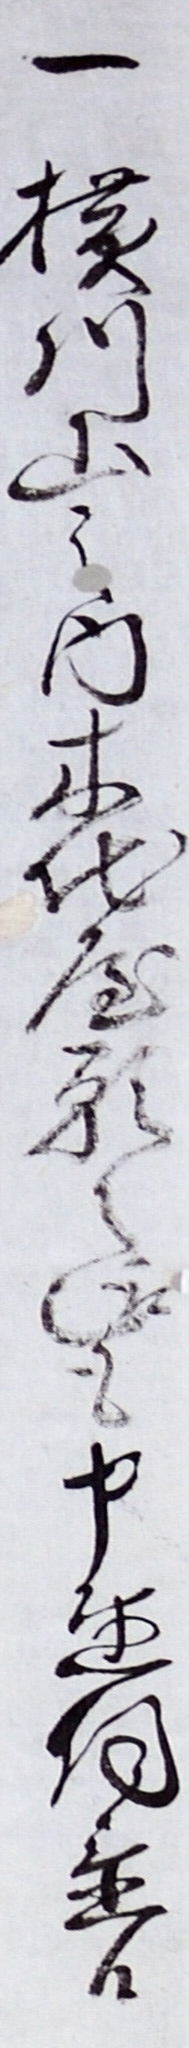一横川山之内木地屋願之趣も申達伺置候
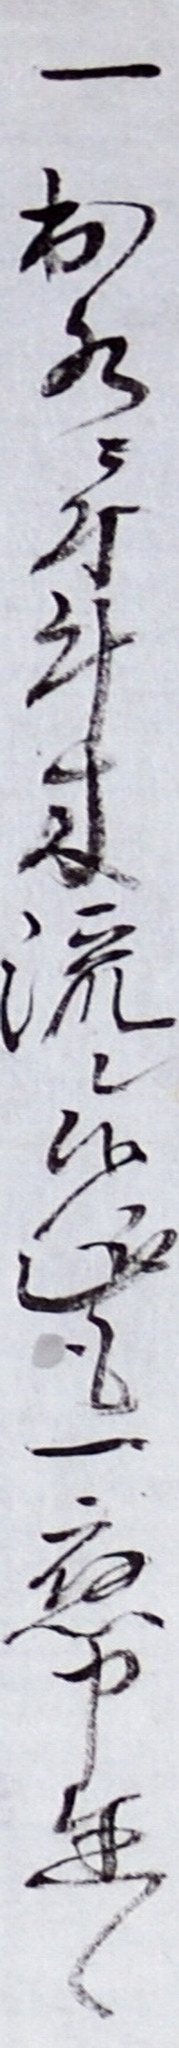一出水ニ付牛木流れ候趣も一応申達候
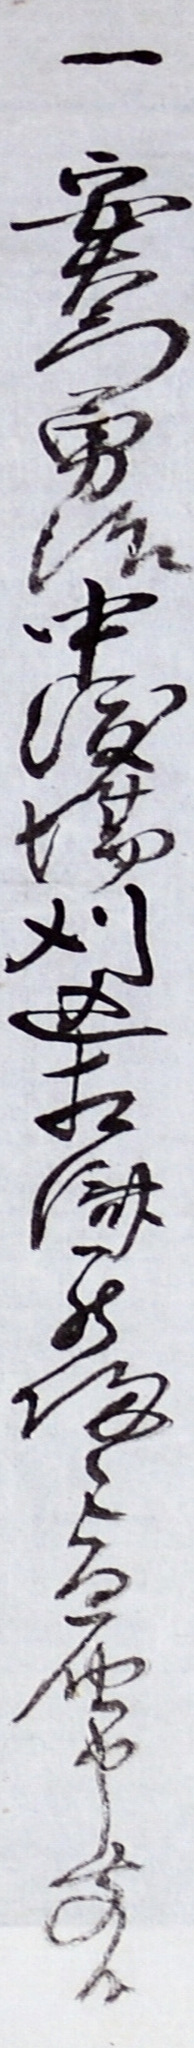一安右衛門勇治中渡場刈込相済罷帰候旨届申聞候
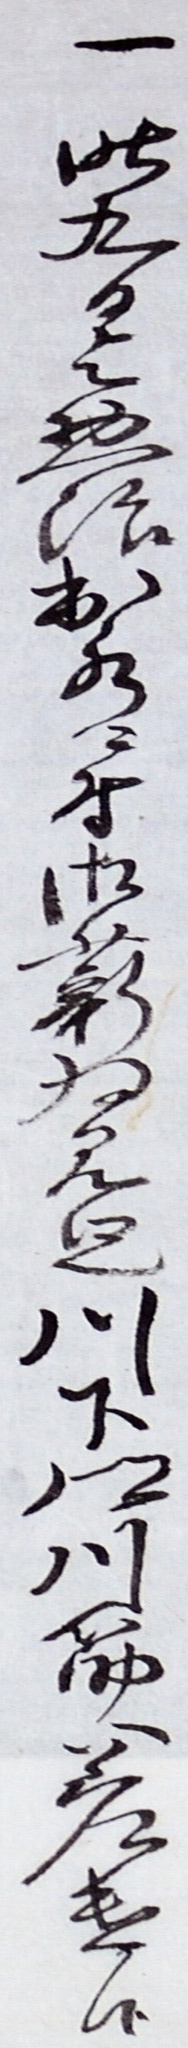一昨五日与惣治出水ニ付御薪為見廻川下郷川筋へ差遣候
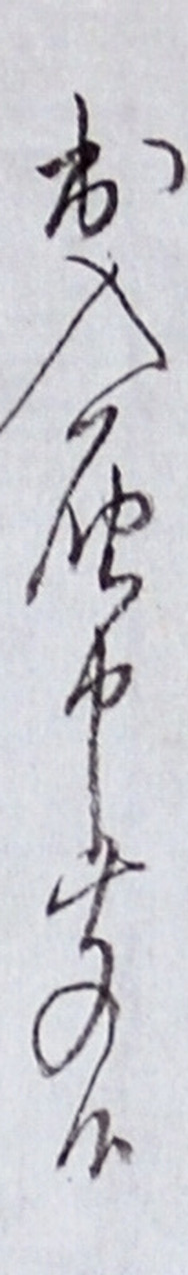出入届申聞候
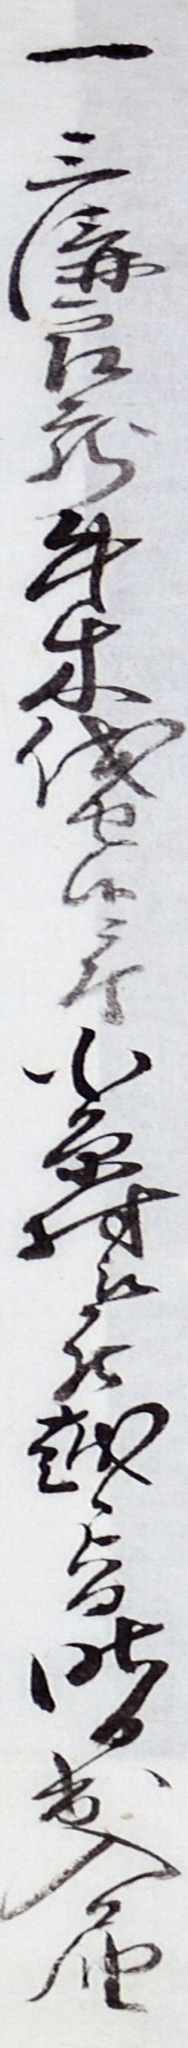一三溝良蔵牛木伐せ候ニ付小原村江罷越候旨昨日出入由
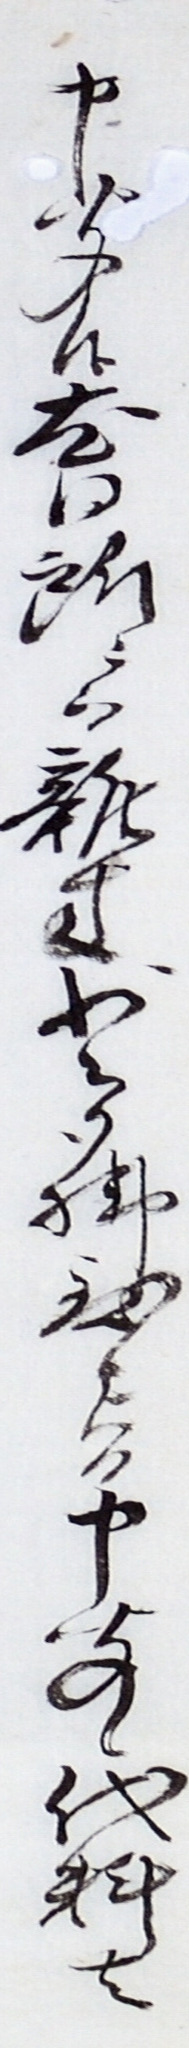申聞候尤同所ニ而雑木少々御払致候旨申聞候代料は
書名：御山奉行御用控
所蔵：伊那市立高遠町図書館・合同会社AMANE
